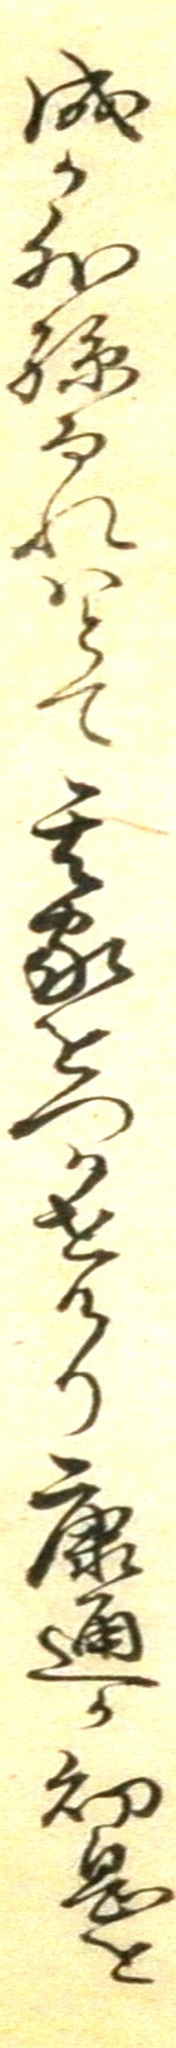成か外孫なれはとて其家をつかせけり康通か幼息を
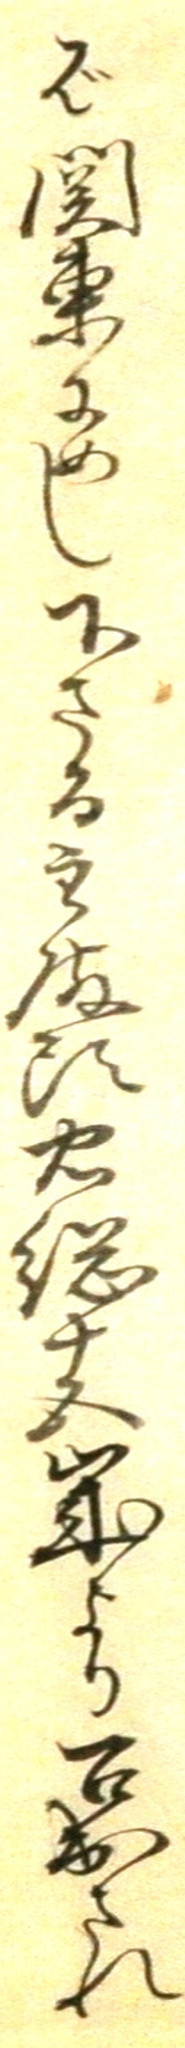ば関東にめし下さる主殿頭忠総十五歳より召出され
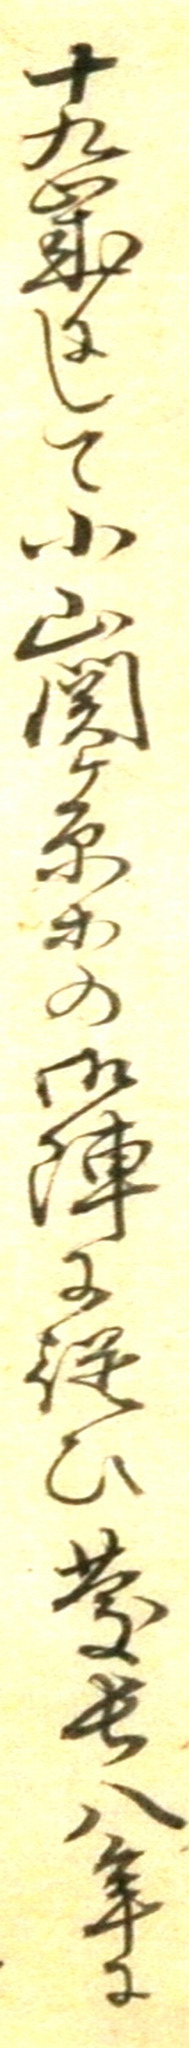十九歳にして小山関ヶ原等の御陣に従ひ慶長八年に
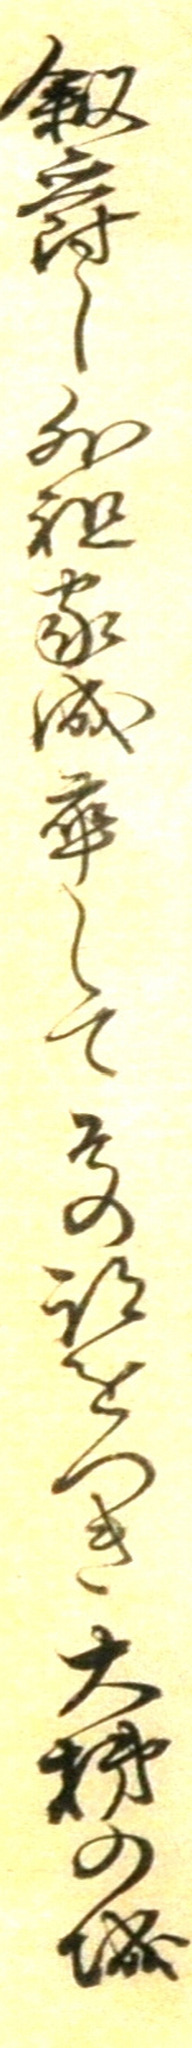叙爵し外祖家成卒してその跡をつき大柿の城

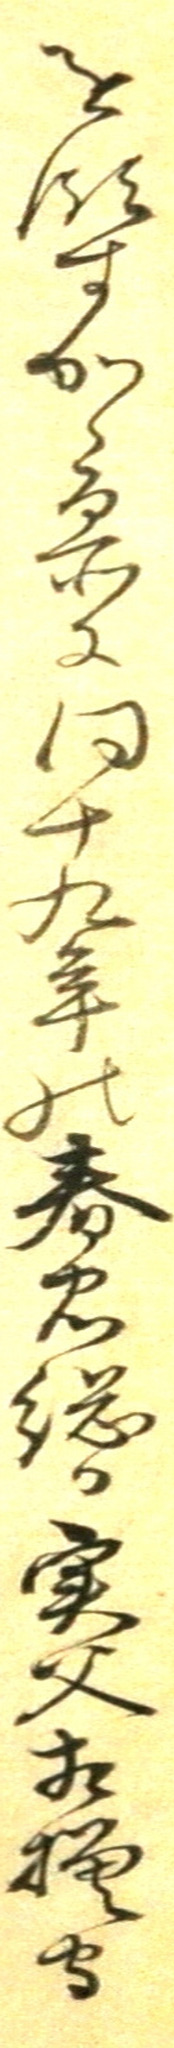を領すかゝる所に同十九年の春忠総か実父相模守
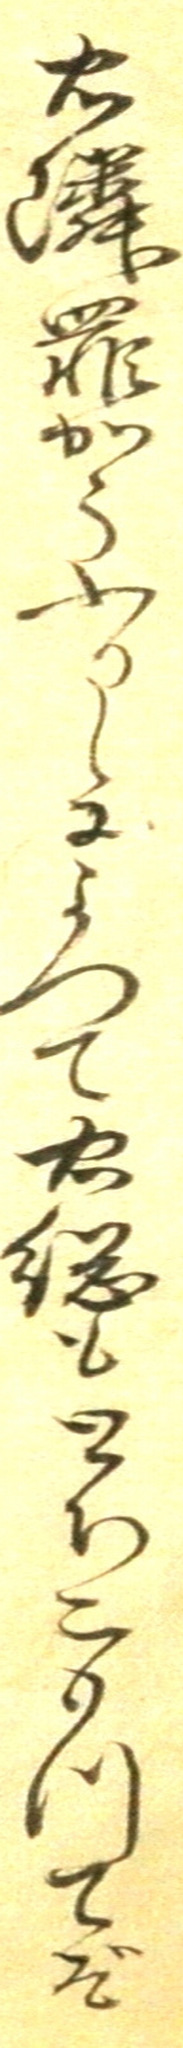忠隣罪かうふりしによつて忠総もとちこもつてぞ
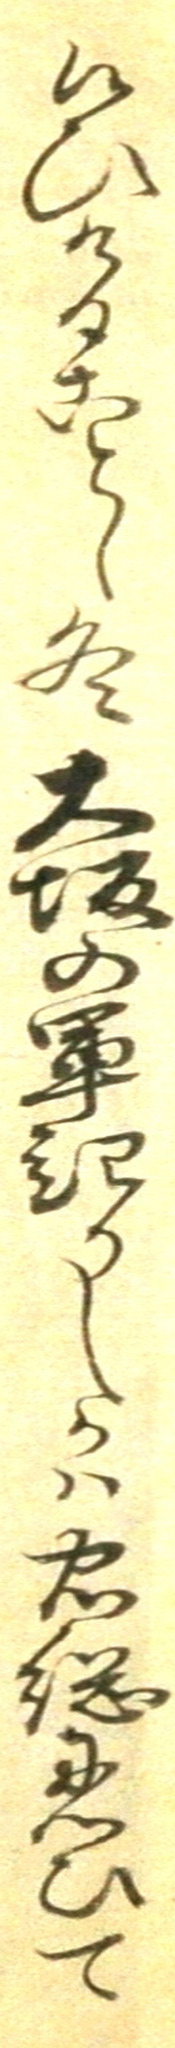候ひけることし冬大坂の軍起りしかは忠総忍ひて
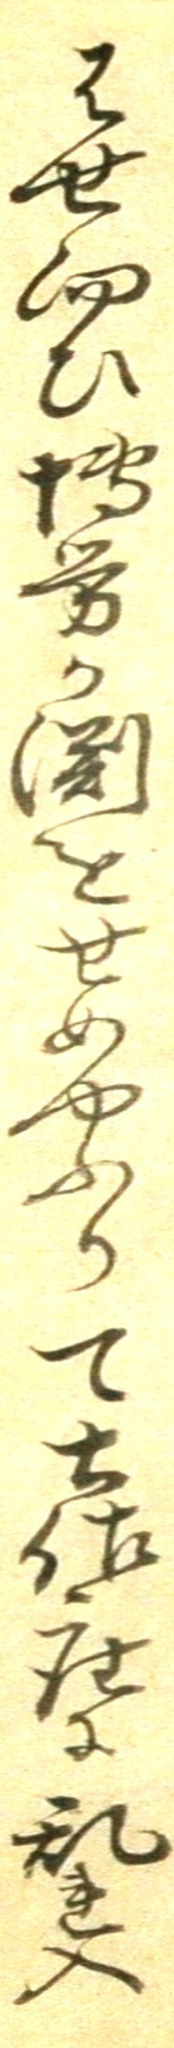はせ向ひ博労か渕をせめやふりて土佐座に乱れ入
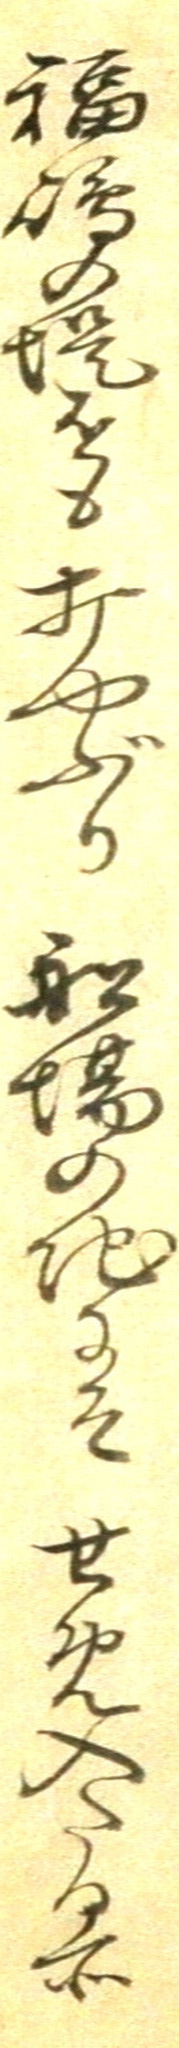福嶋の堤をも打やぶり舩場の地にそせめ入たる所
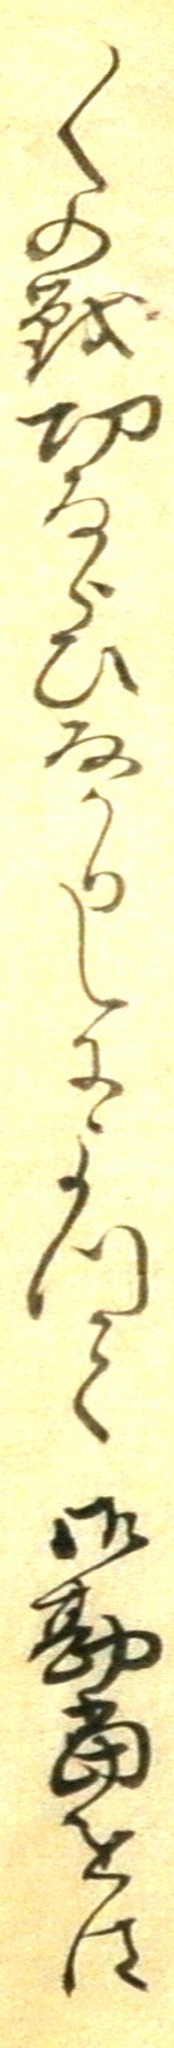〳〵の戦功ならひなかりしによつて御勘当をは
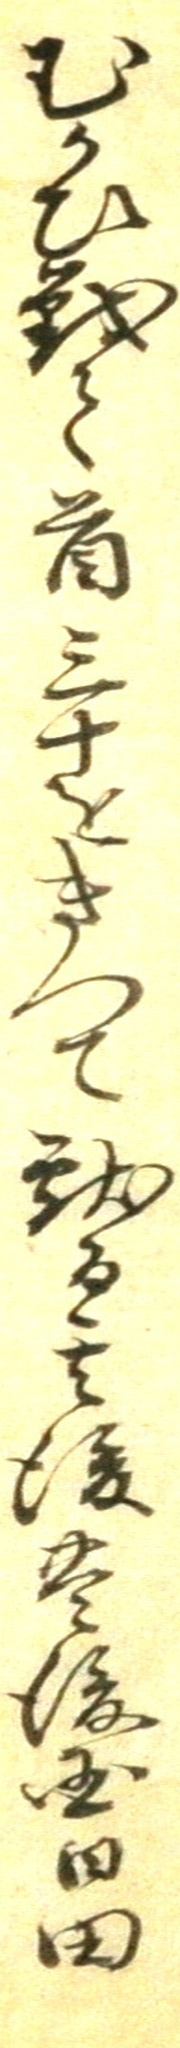むかひ戦て首三十をきつて献る其後豊後国日田
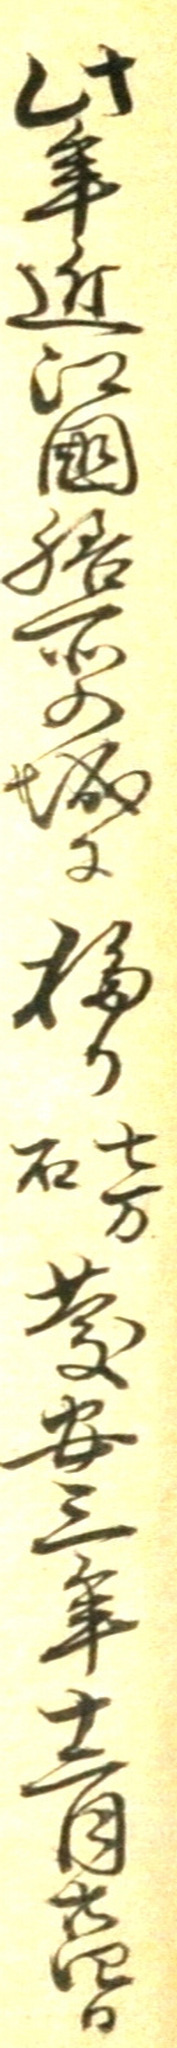此年近江国膳所の城に移り七万石慶安三年十二月廿四日
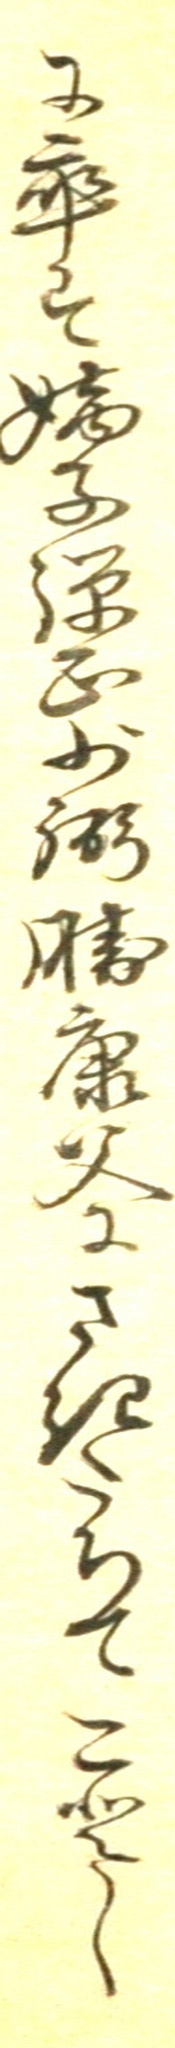に卒す嫡子弾正少弼勝康父にさきたちてことし
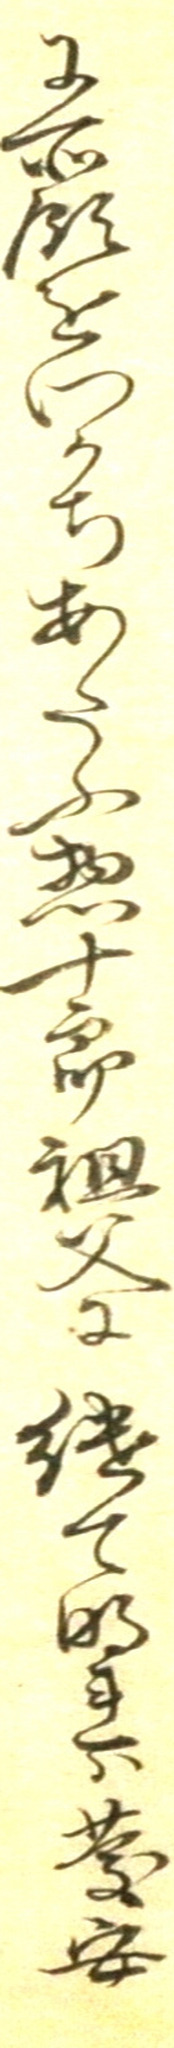に所領をわかちあたふ惣十郎祖父に継て明れは慶安
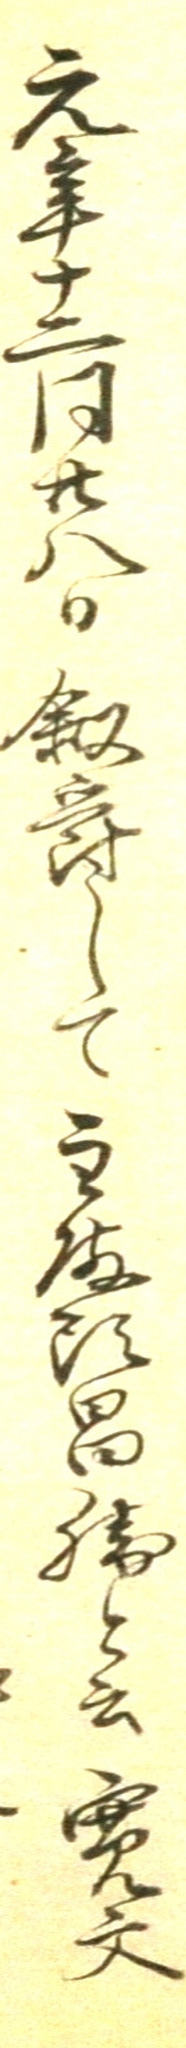元年十二月廿八日叙爵して主殿頭昌勝と云寛文
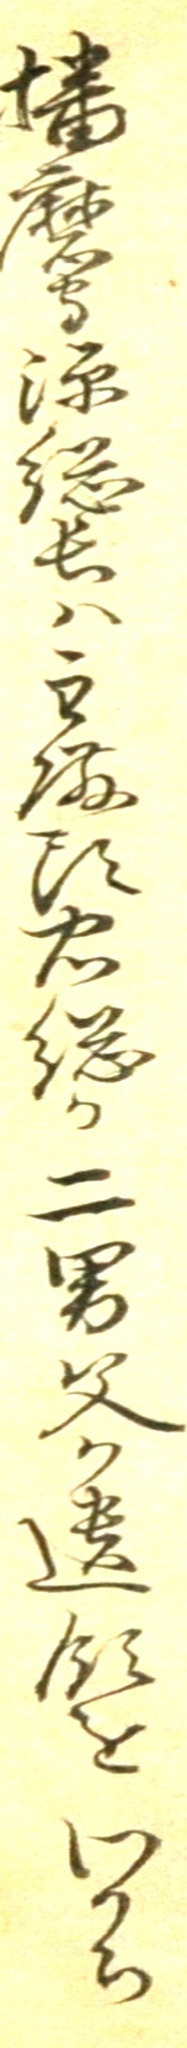播磨守源総長は主殿頭忠総か二男父か遺領をわかち
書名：藩翰譜（四・中）
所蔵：伊那市立高遠町図書館・合同会社AMANE
